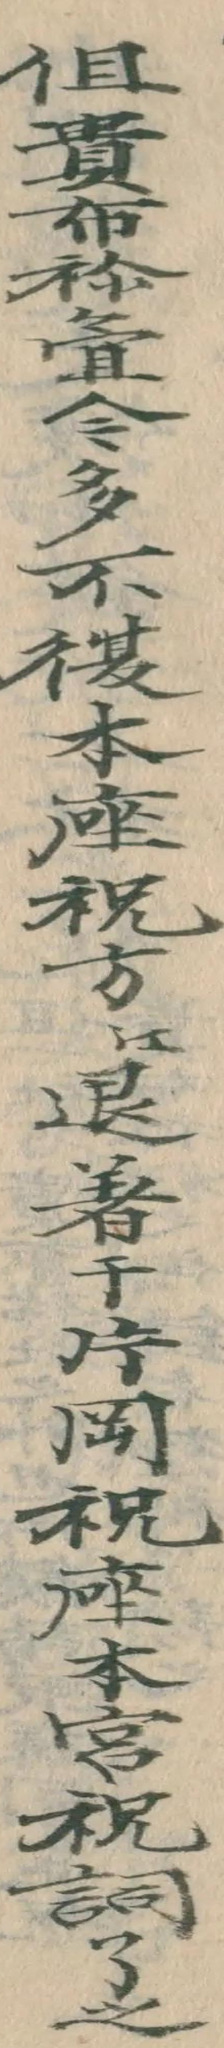但貴ふね々宜令多不復本座税方江退着于片岡祝座本宮祝詞了之
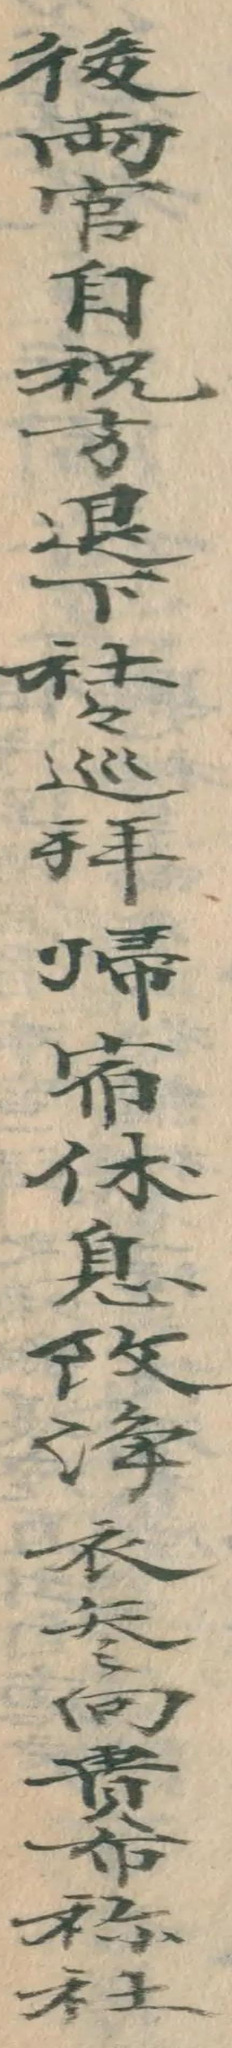後両官自祝方退下社々巡拝帰宿休息改浄衣参向貴ふね社

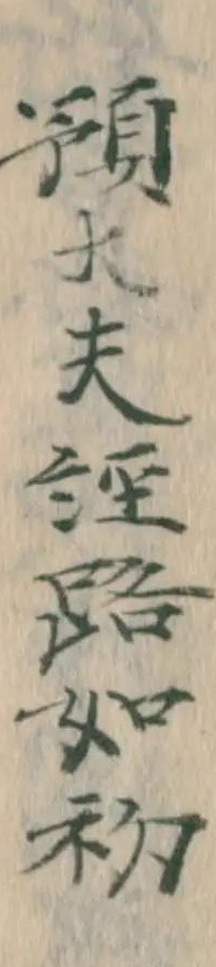預大夫経路如初
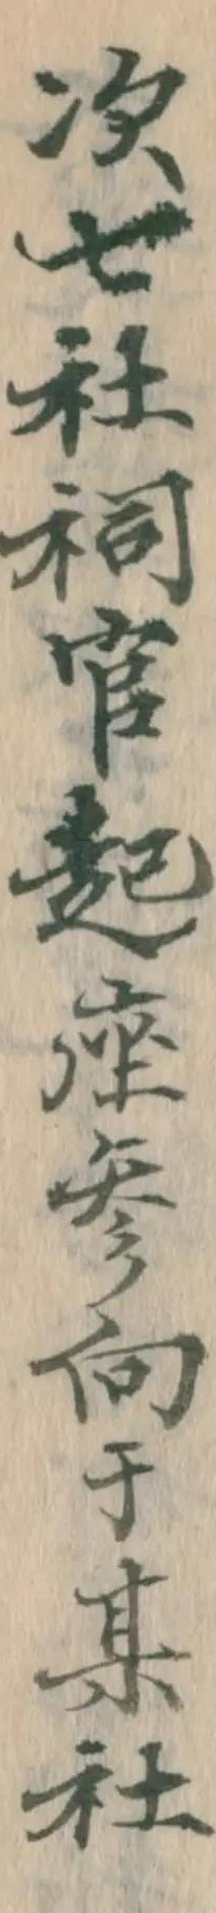次七社祠官起座参向于某社
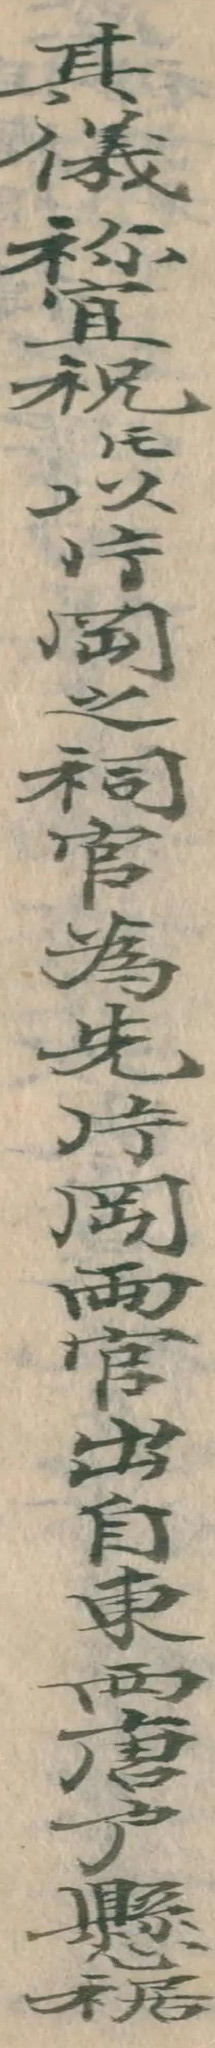其儀祢宜祝トモ以片岡之祠官為先片岡両官出自東西唐戸懸裾
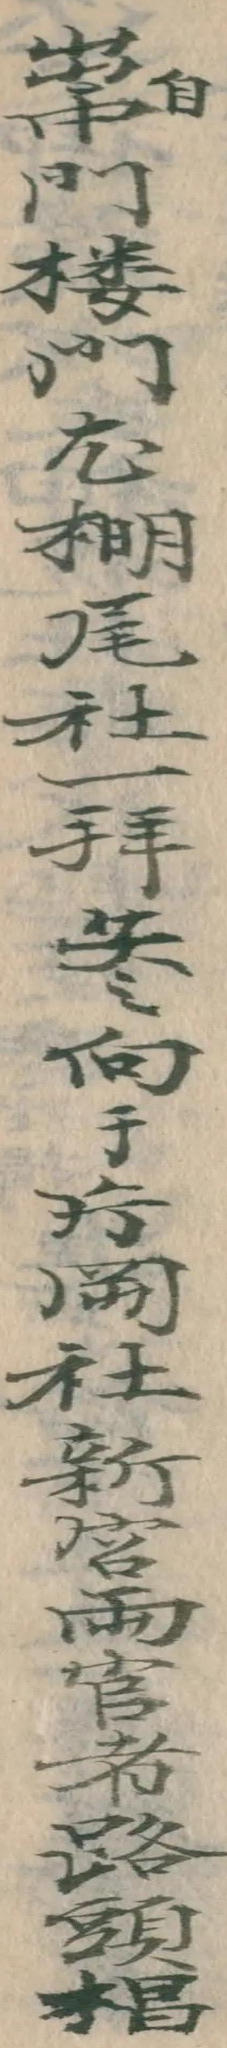出◦中門楼門尤棚尾社一拝参向于片岡社新宮両官者路頭椙
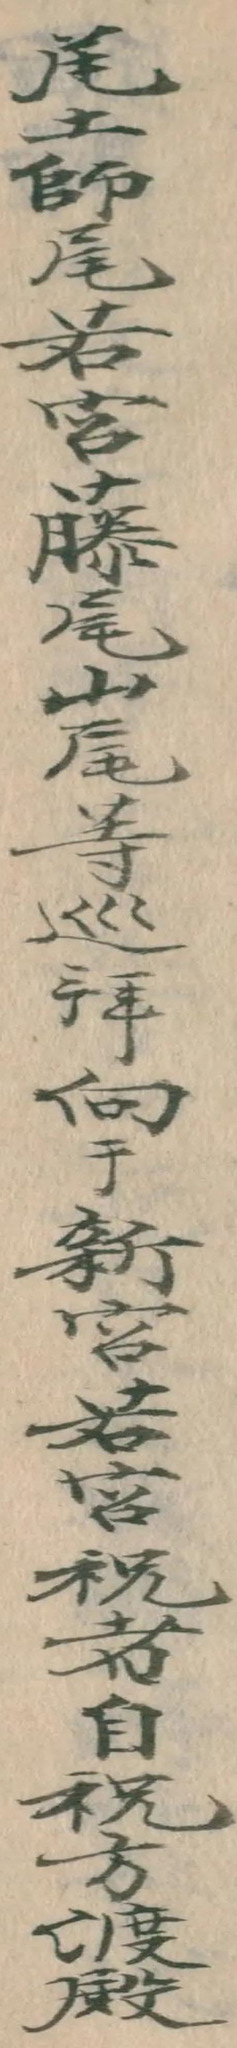尾土師尾若宮藤尾山尾等巡拝向于新宮若宮祝者自祝方渡殿
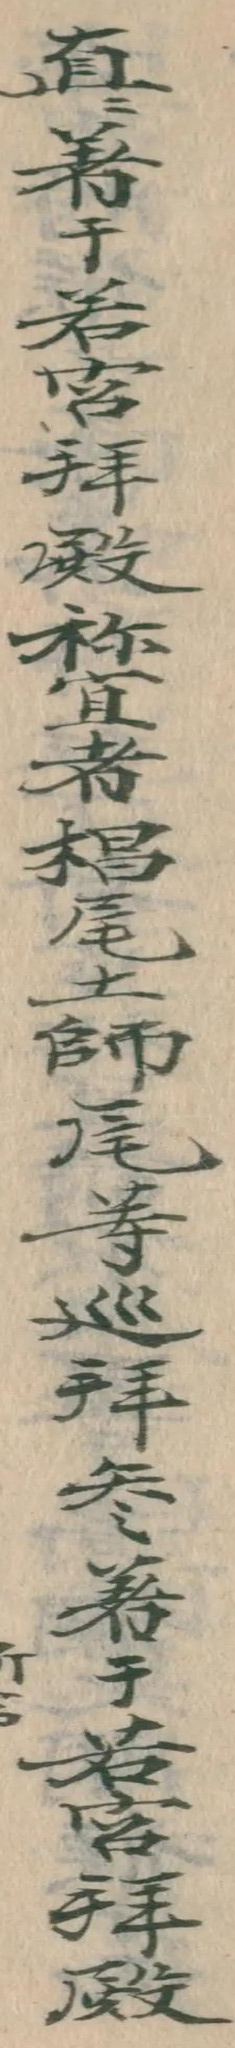直ニ着于若宮拝殿称宜者椙尾土師尾等巡拝参着于若宮拜殿
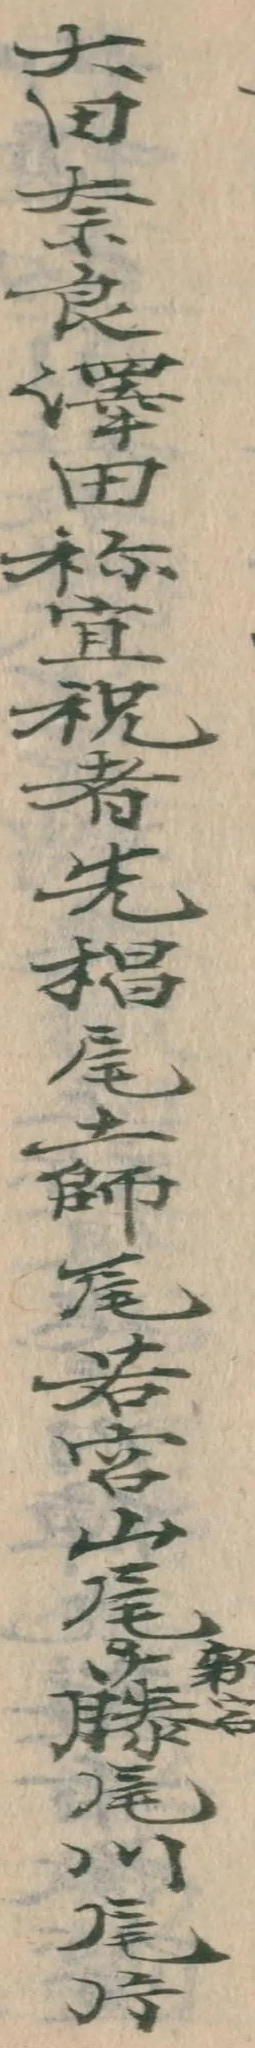大田奈良沢田祢宜祝者先椙尾土師尾若宮山尾◦藤尾川尾片
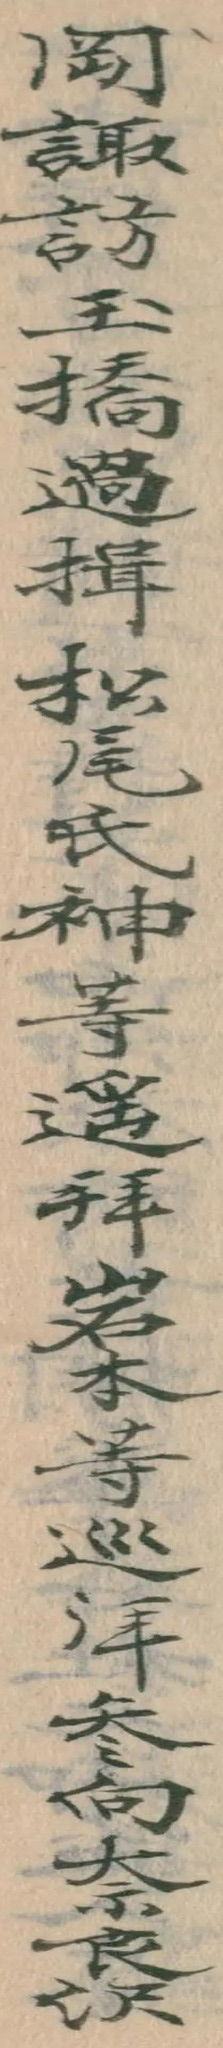岡諏訪玉橋過揖松尾氏神等遥拝岩本等巡拝参向奈良沢
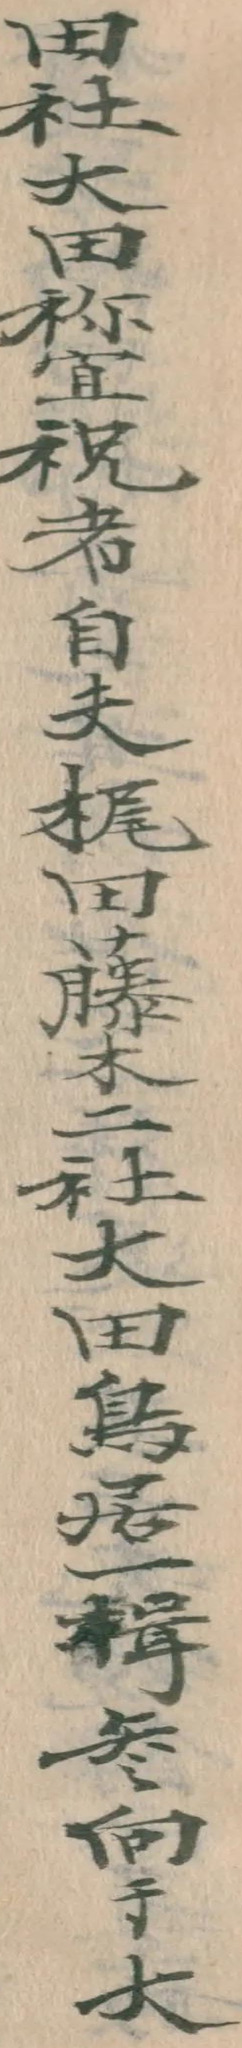田杜大田祢宜祝者自夫梶田藤木二社大田鳥居一揖参向于大
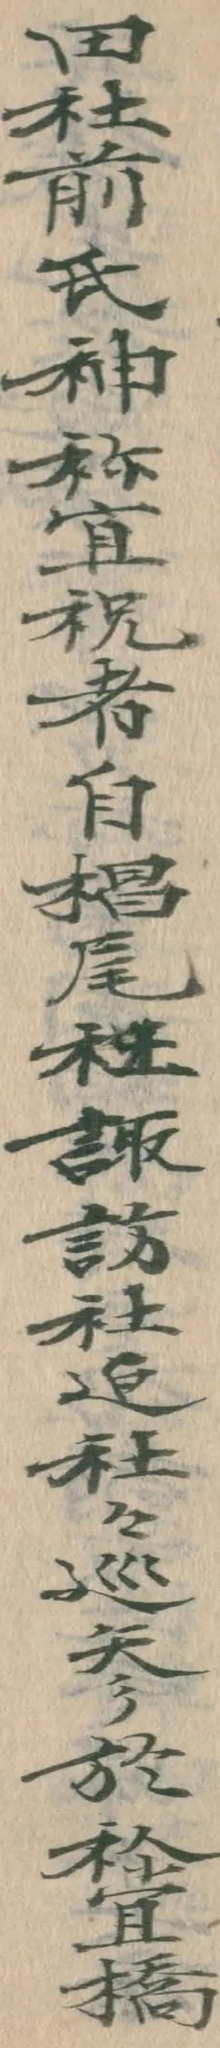田社前氏神祢宜祝者自椙尾社諏訪社迄社々巡参於祢宜橋
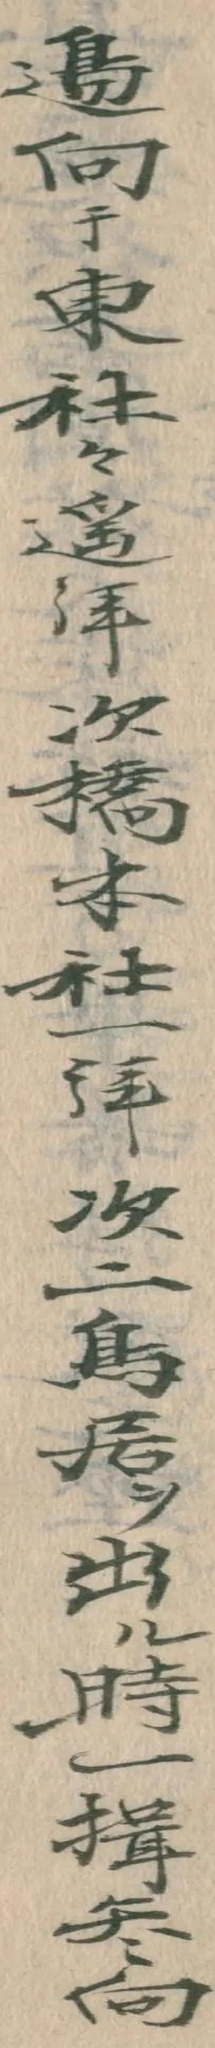辺向于東社々遥拝次橋本社一拝次二鳥居ヲ出ル時一揖参向
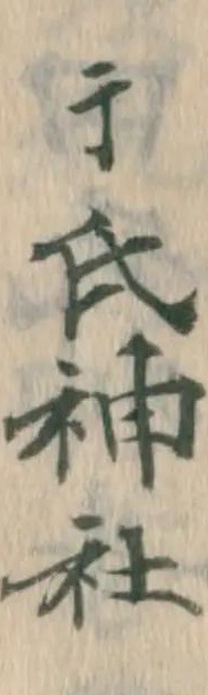于氏神社
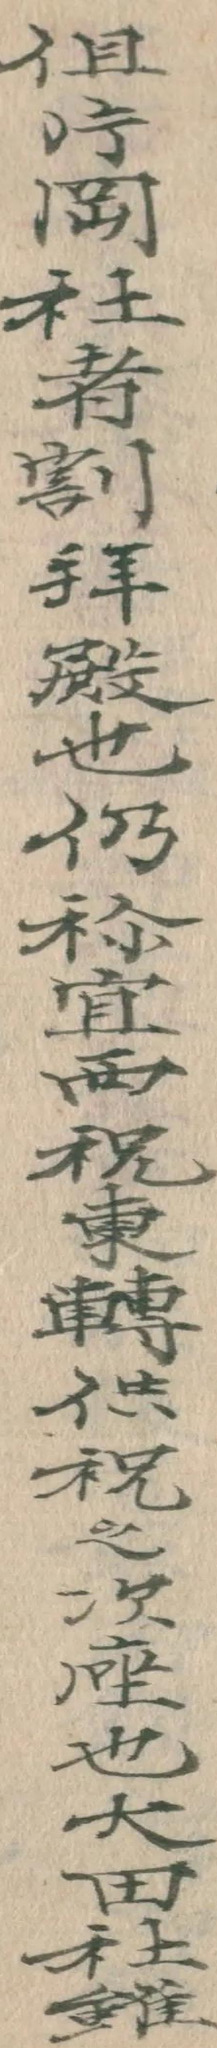但片岡社者割拝殿也仍称宜両祝東転供祝之次座也大田社雖
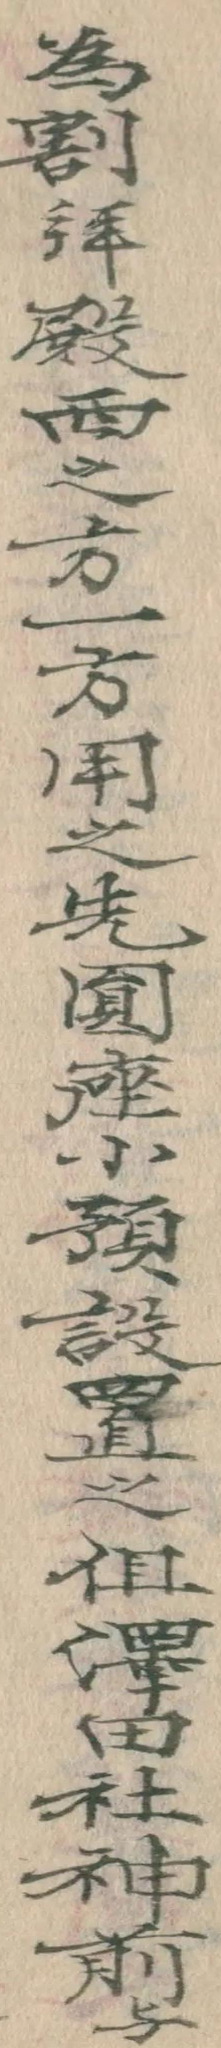為割拝殿西之方一方用之先円座小預設置之但沢田社神前与
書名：賀茂社記録. 第9冊
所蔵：国立国会図書館 National Diet Library, JAPAN
